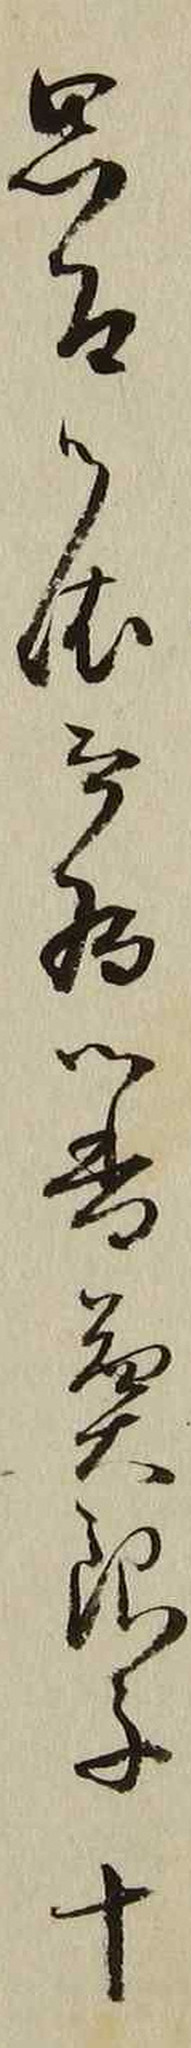思召候依而為御香典銀子十
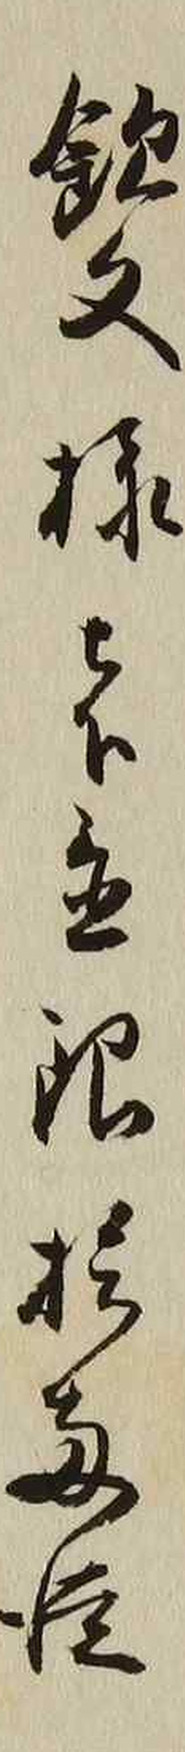欽文様被下置銀拾両従
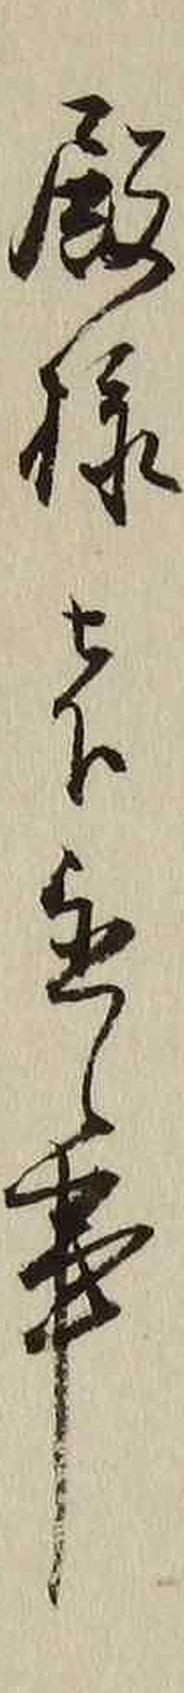殿様被下置候事
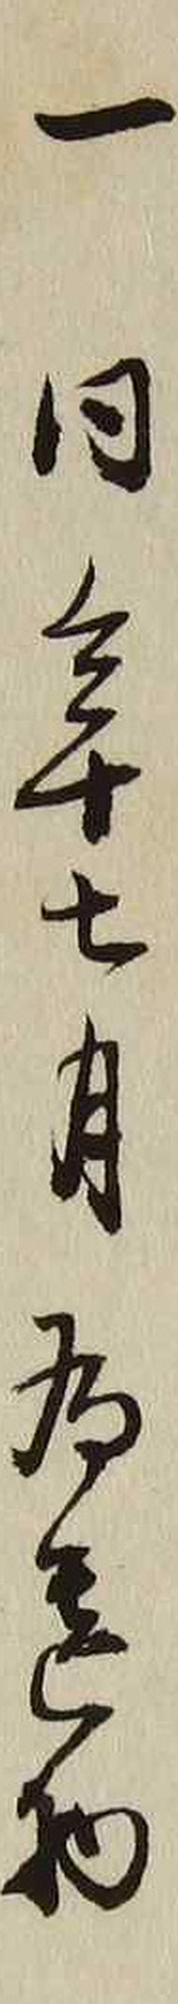一同年七月為遺物
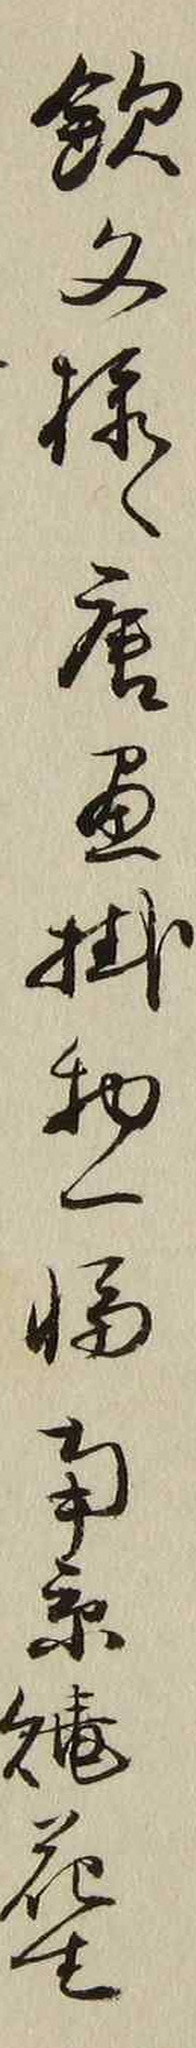欽文様へ唐画掛物一輻南京焼花生
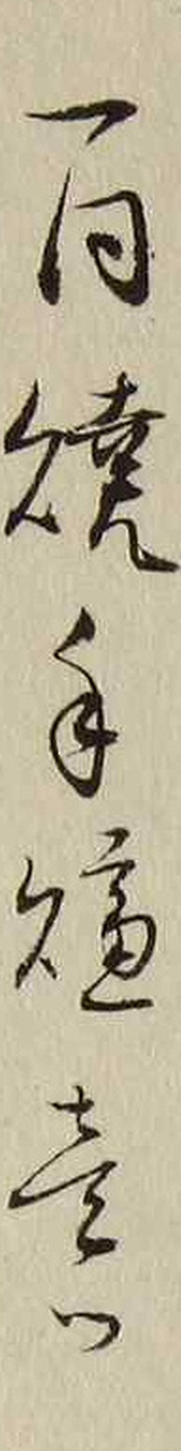一同焼手爐壱つ
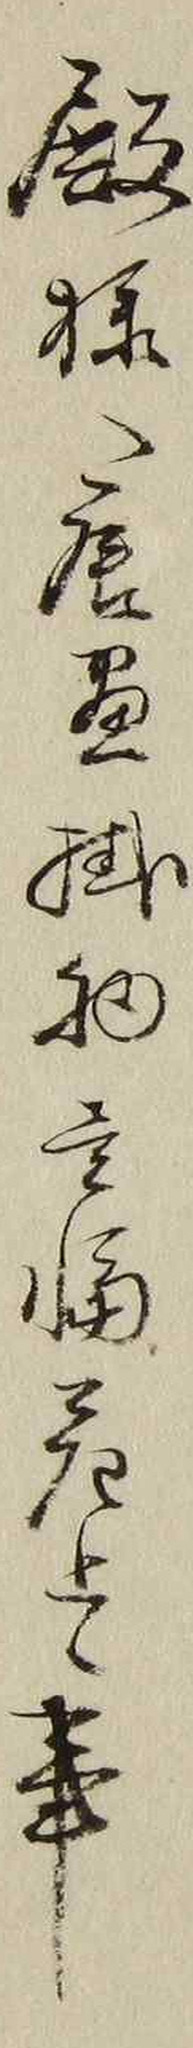殿様へ唐画掛物壱輻差上候事
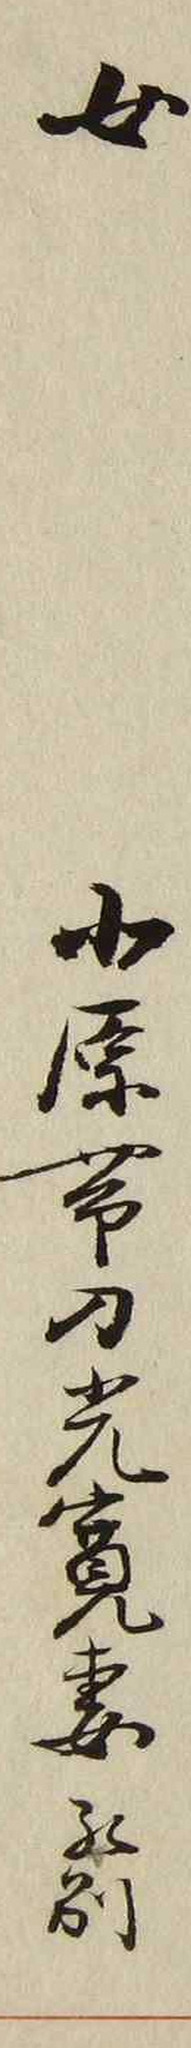女小原帯刀光寛妻死別
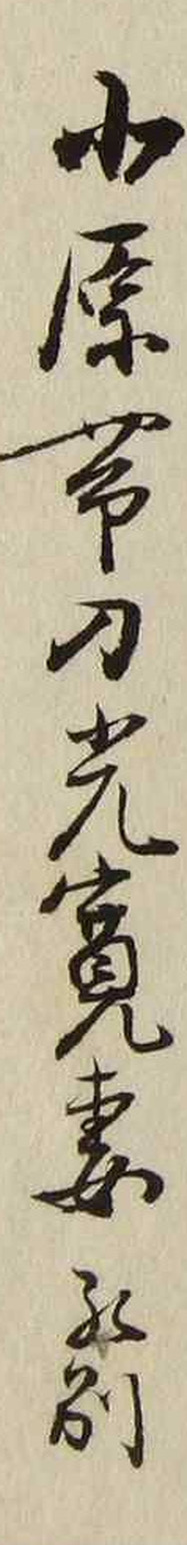女小原帯刀光寛妻死別

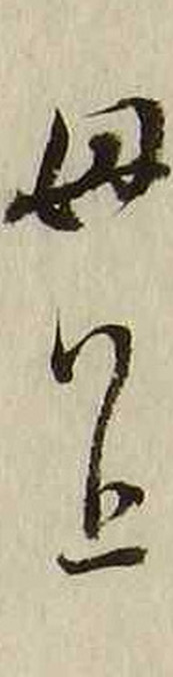母同上
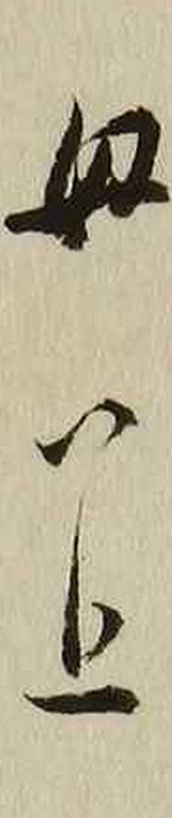母同上
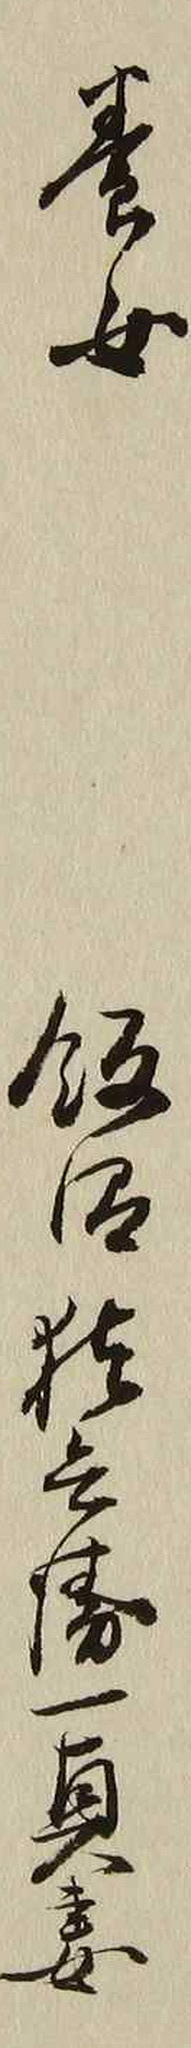養女飯沼猪兵衛一貞妻
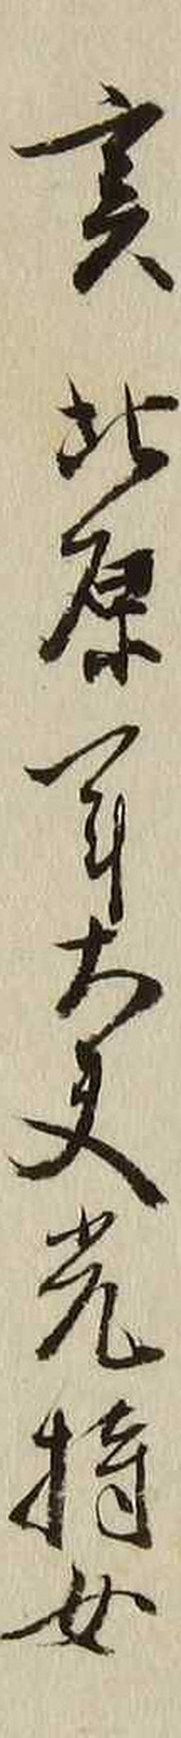実北原年太夫光持女
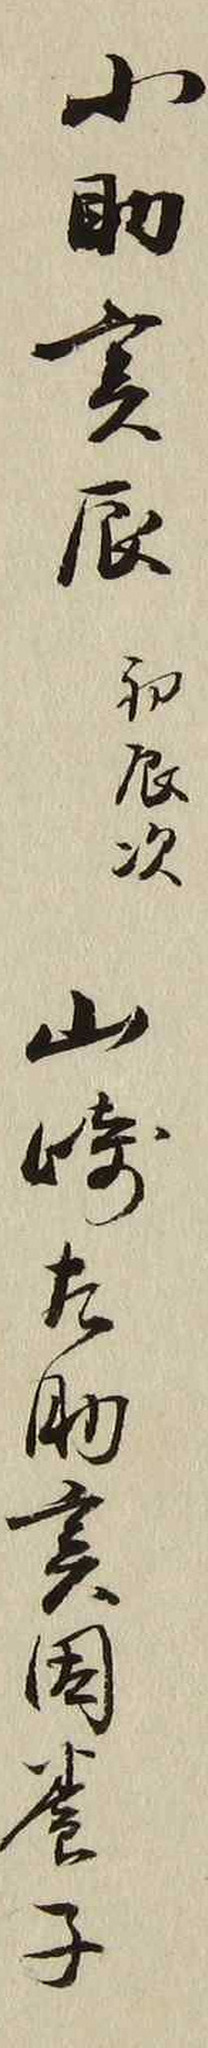小助実辰初辰次山崎左助実因養子
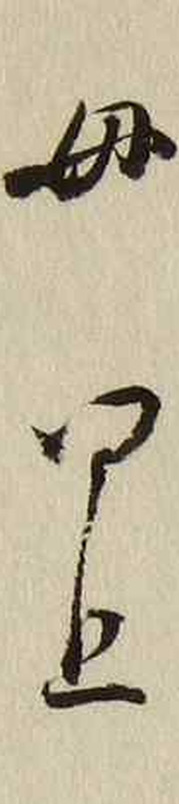母同上

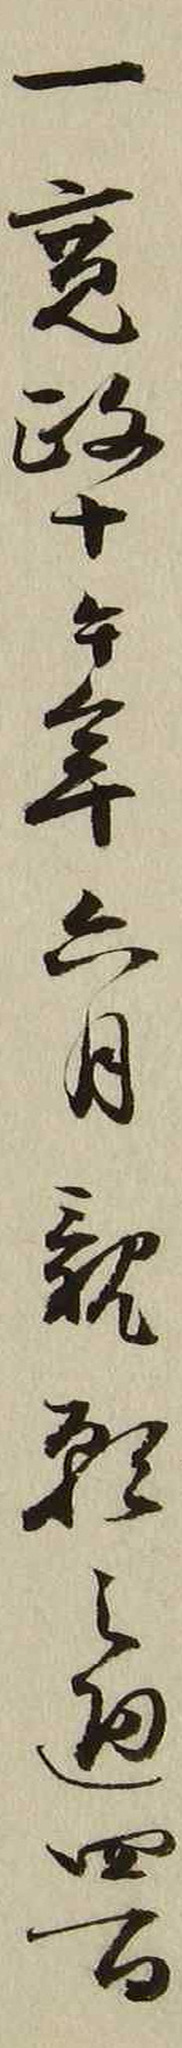一寛政十午年六月親願之通四百
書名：諸士系譜　巻之292　き之部1
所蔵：会津若松市立会津図書館
